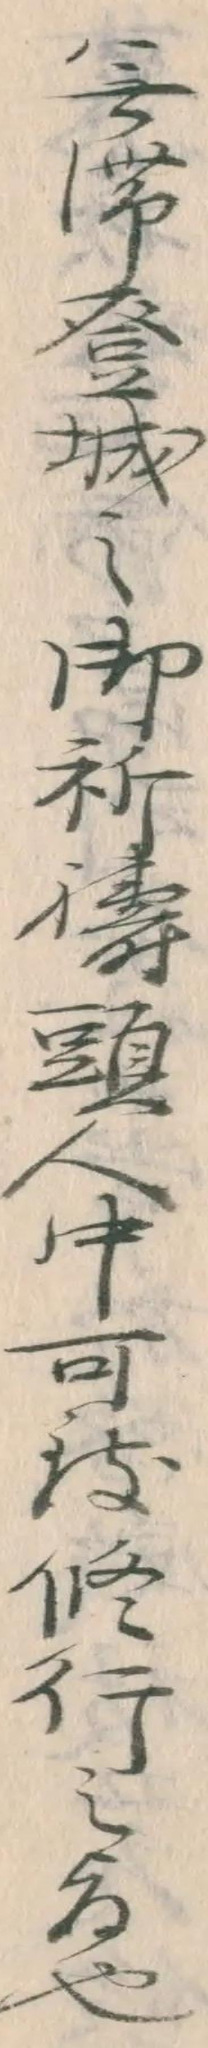無滞登城之御祈祷頭人中可致修行之旨也
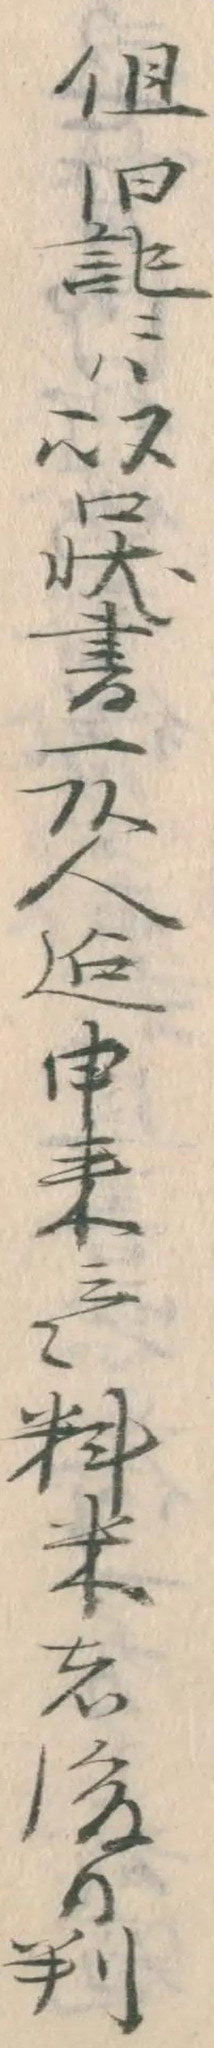但旧記ニハ以口状書一頭人迄申来云々料米は後日判
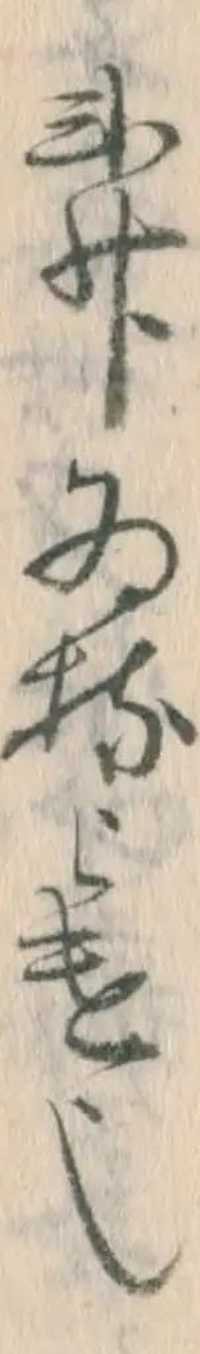弐升為持被遣也

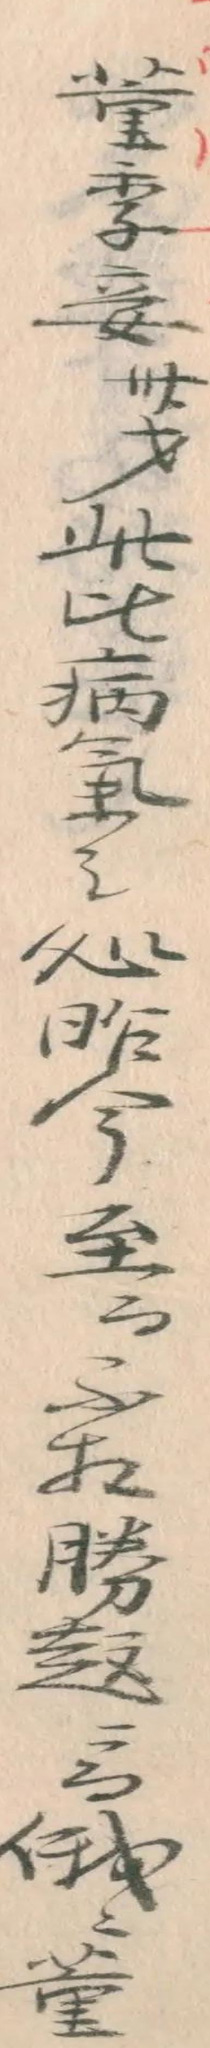一董季妾卅才此比病氣之処昨今至而不相勝趣ニ而俄ニ董
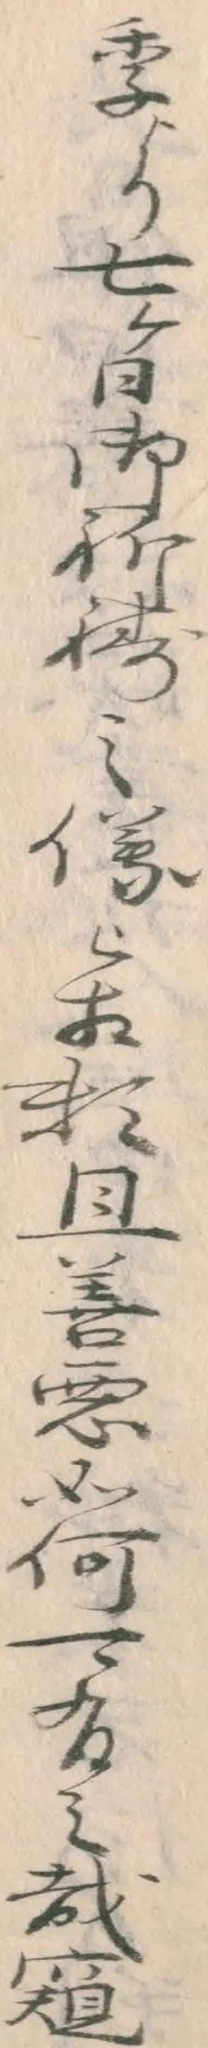季より七ヶ日御祈祷之儀被相頼且善悪如何可有之哉窺
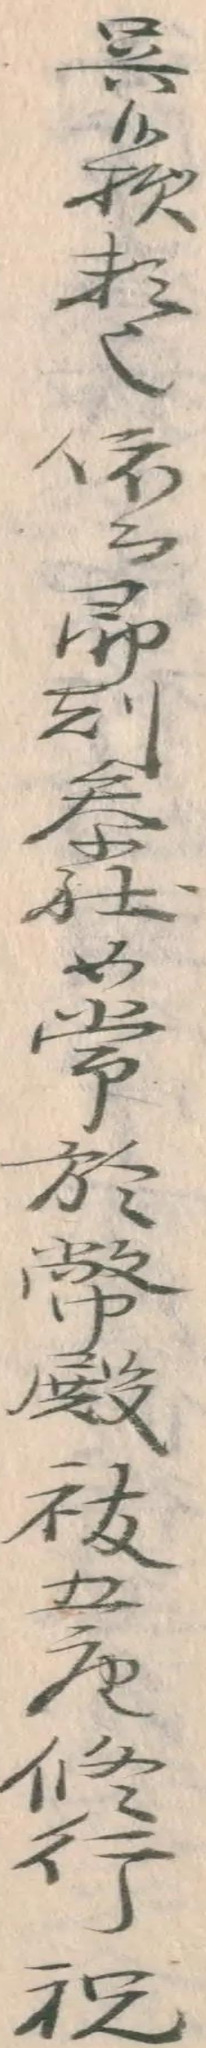呉候様頼也依而即刻参社如常於幣殿祓五座修行祝
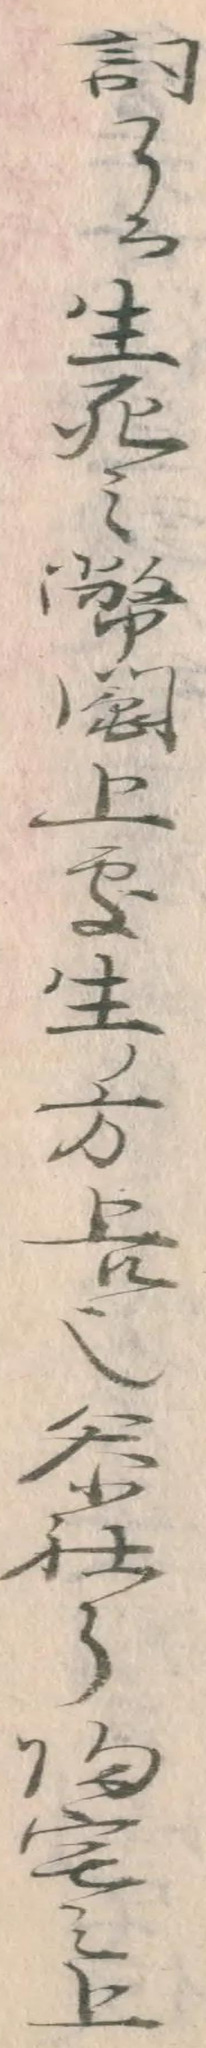詞了而生死之幣鬮上處生ノ方上ル也参社了帰宅之上
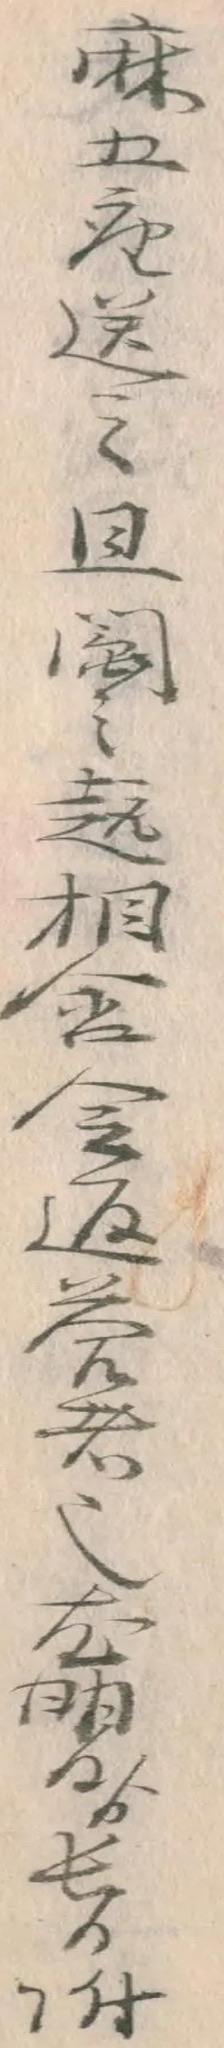麻五座送之且鬮之趣相含令返答者也尤明日ゟ長日附行也
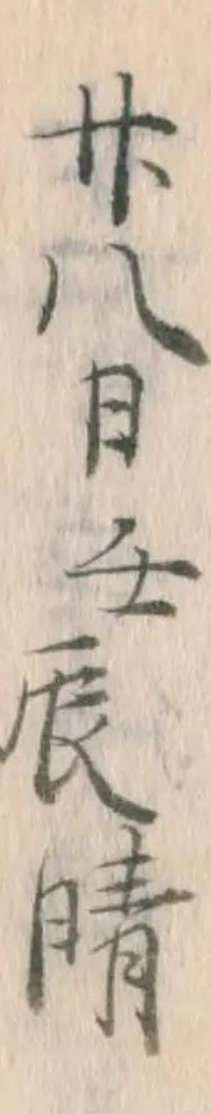廿八日壬辰晴
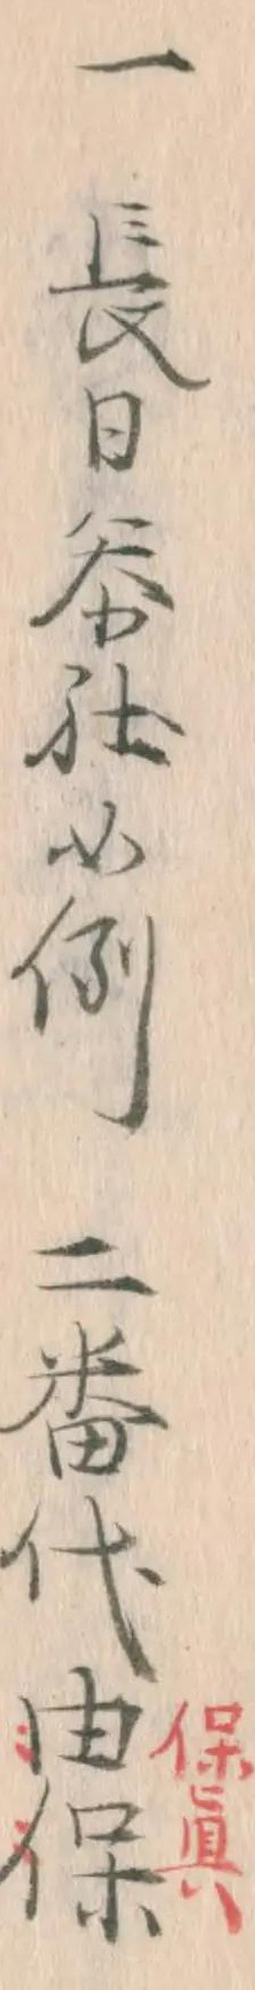一長日参社如例二番代由保
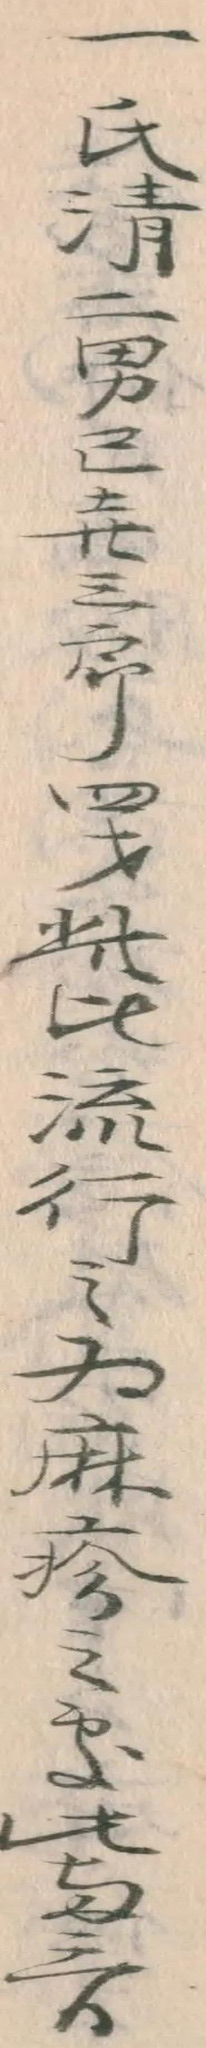一氏清二男巳喜三郎四才此比流行之為麻疹之處此両三日
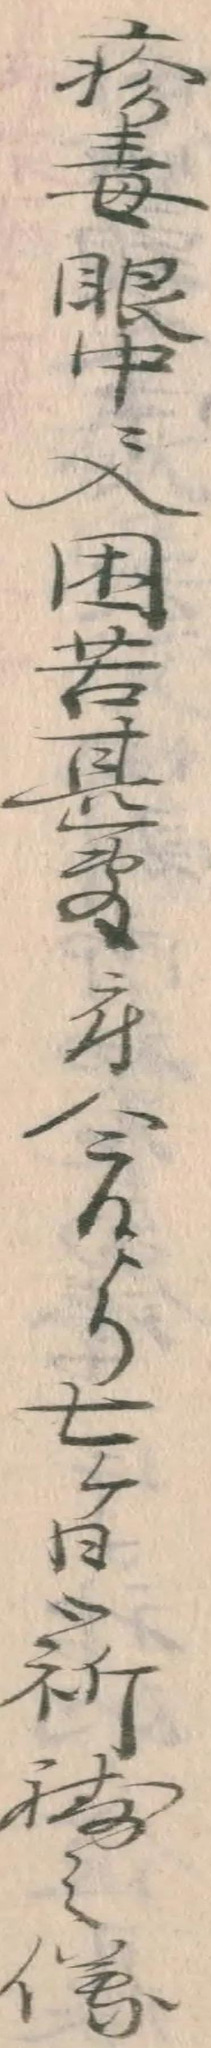疹毒眼中ニ入困苦甚敷ニ付今日より七ケ日御祈祷之儀
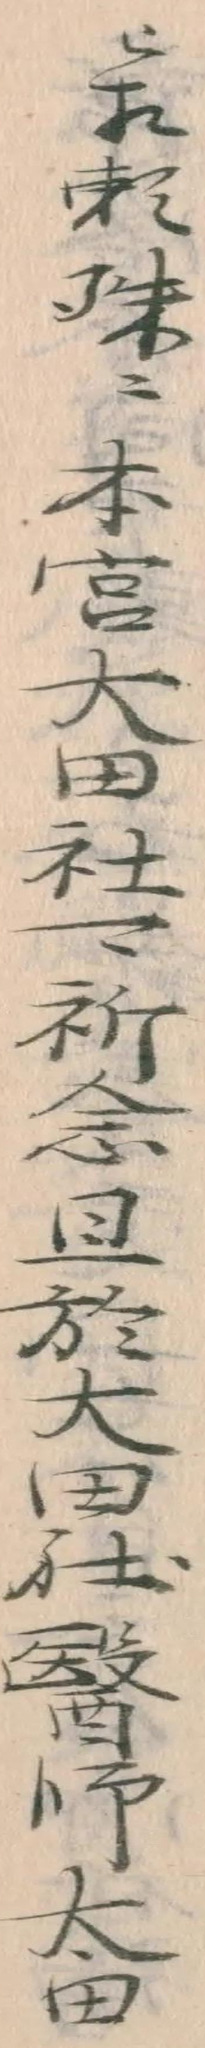被相頼殊ニ本宮大田社可祈念且於大田杜醫師太田
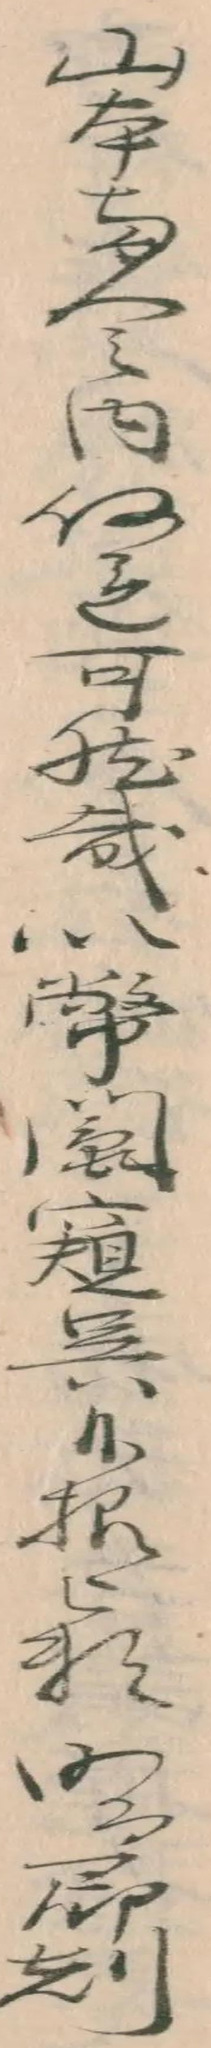山本両人之内何れ可然哉以幣鬮窺呉候様被頼仍而即刻
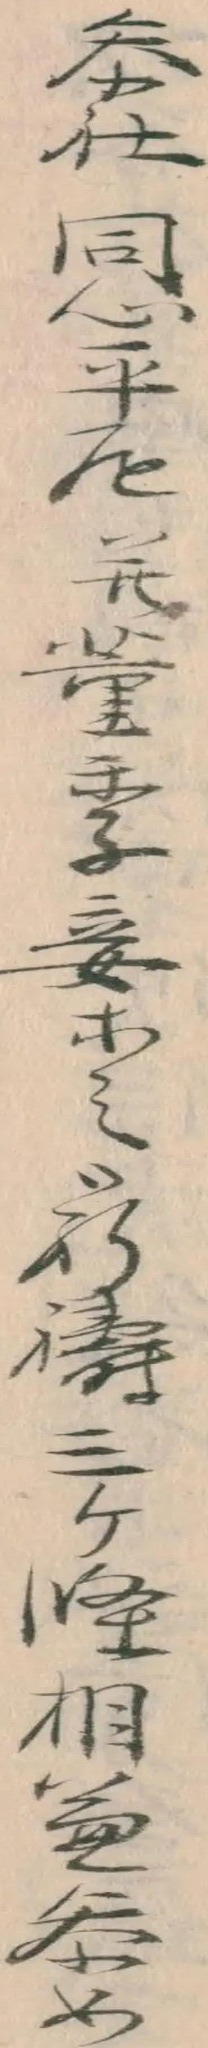参仕同心平尾并董季妾等之御祈祷三ヶ條相兼参如
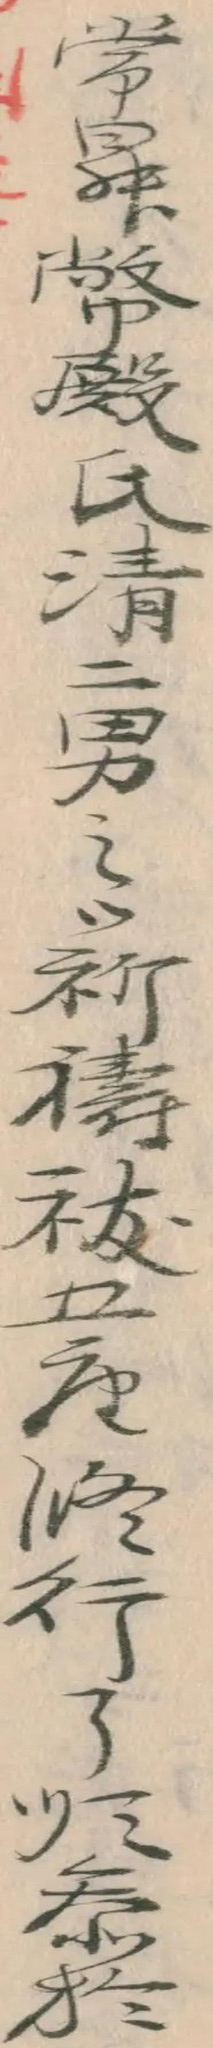常昇幣殿氏清二男之御祈祷祓五座修行了順参於
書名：賀茂社記録. 第73冊
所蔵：国立国会図書館 National Diet Library, JAPAN
